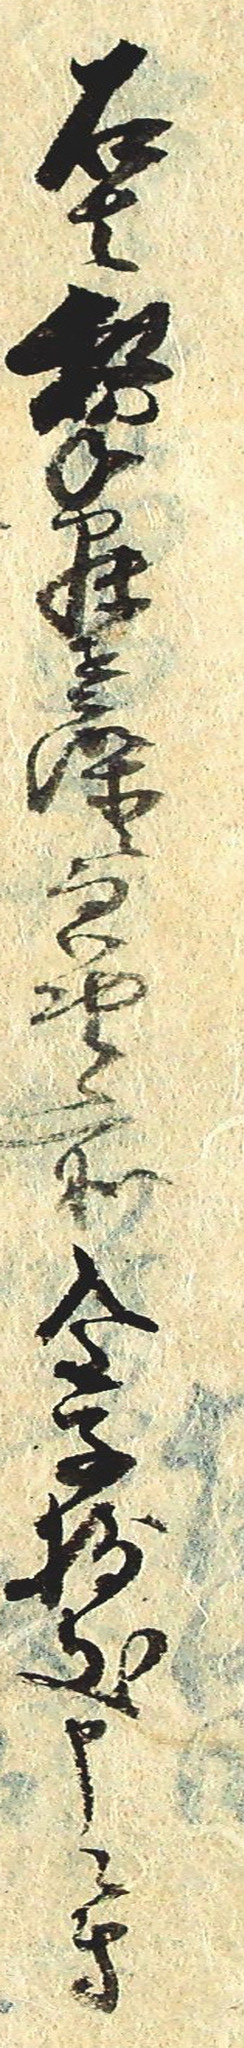右は私手寐せ蒅にて御座候所金子指支申に付
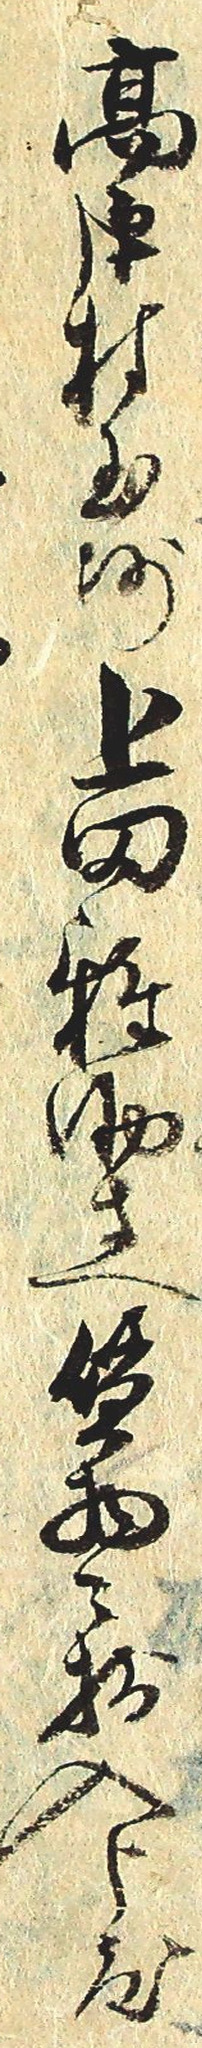高原村玉師上田雅助方へ質物に指入申度
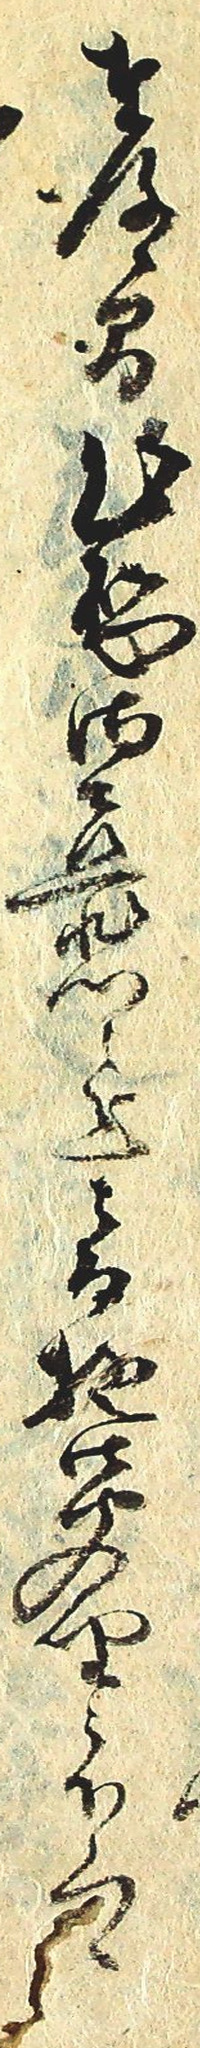奉存候間乍恐御慈悲之上被為遊御聞届被下候はゝ
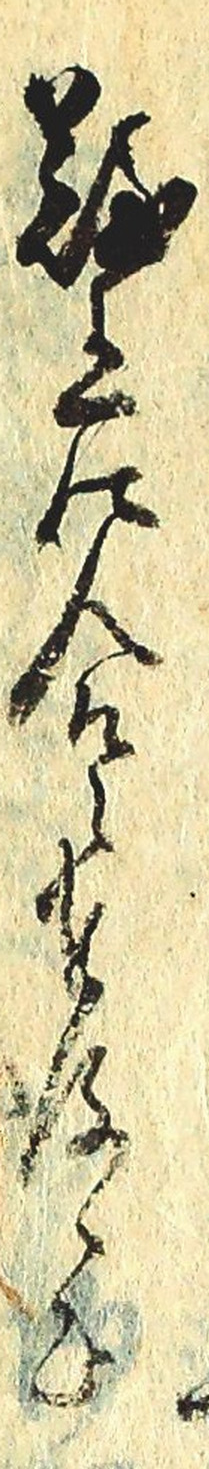難有仕合に奉存候以上
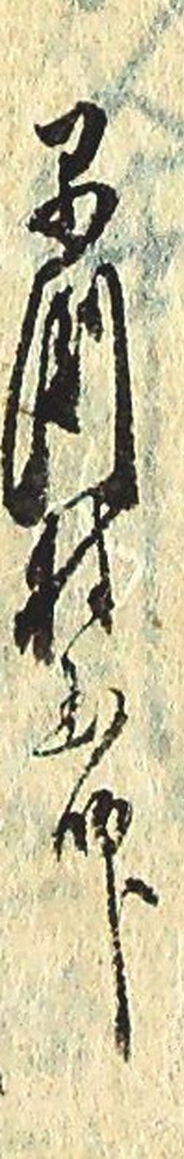早淵村玉師
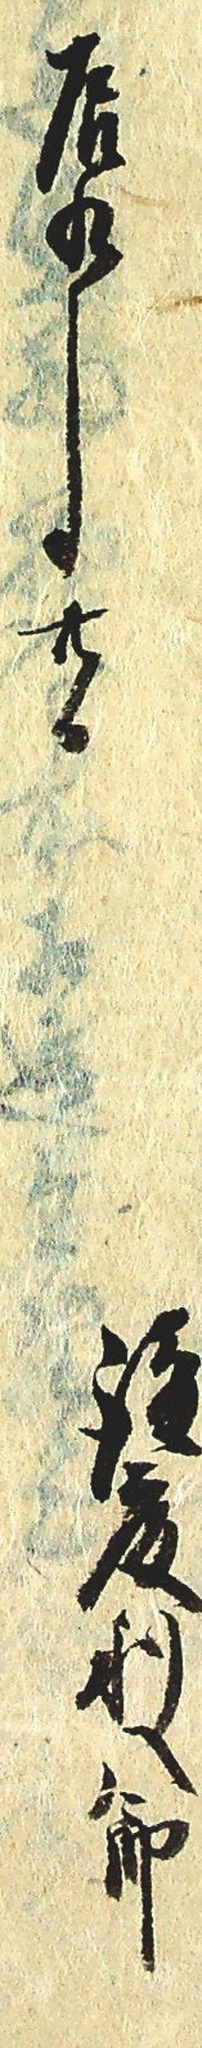辰九月廿日後藤利八郎
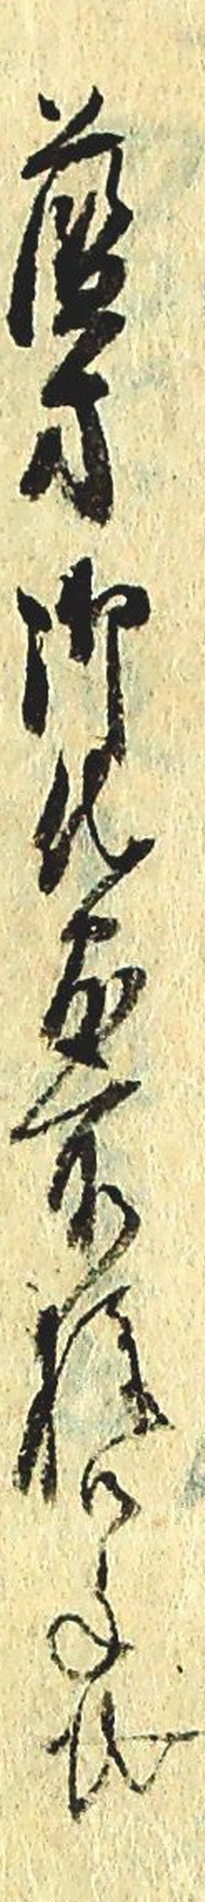藍方御代官所様御手代
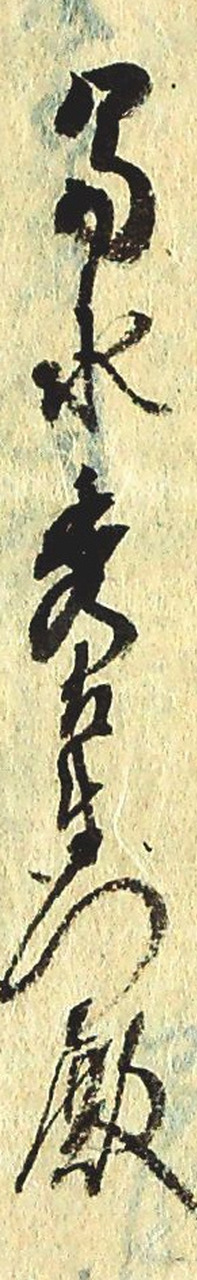富永秀左衛門殿
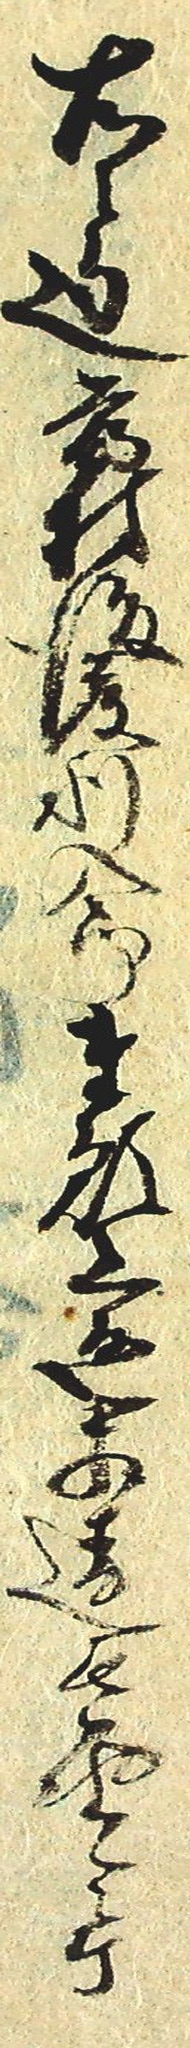右之通当村後藤利八郎奉願上通相違無御座候に付
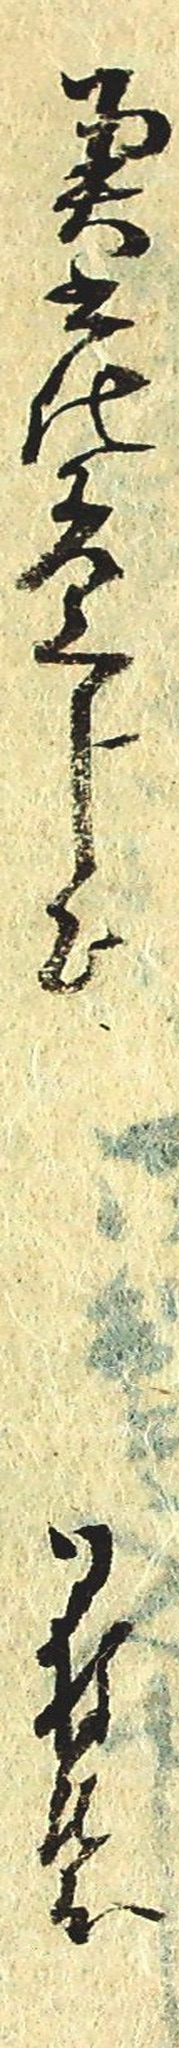奥書仕差上申候以上同村庄屋
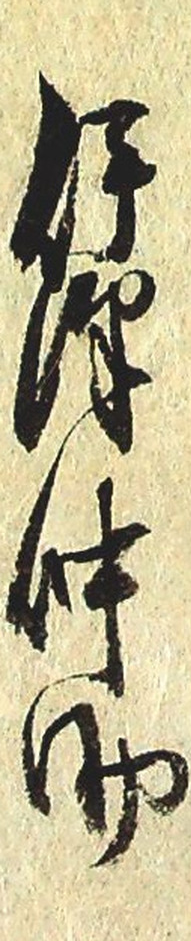伊沢仲助
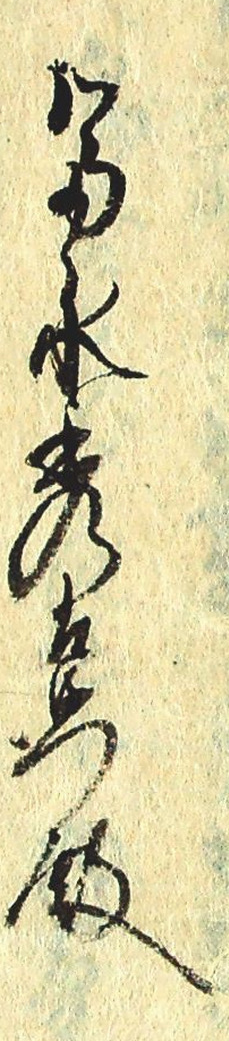富永秀左衛門殿
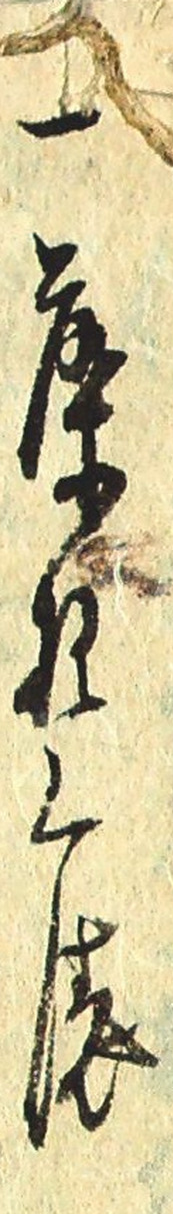一蒅拾三俵
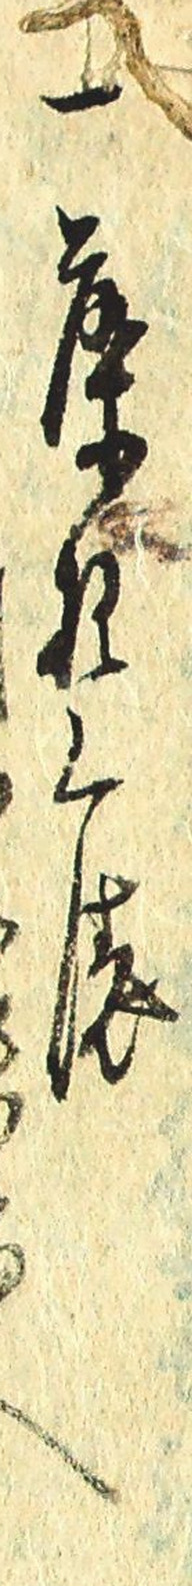一蒅拾三俵

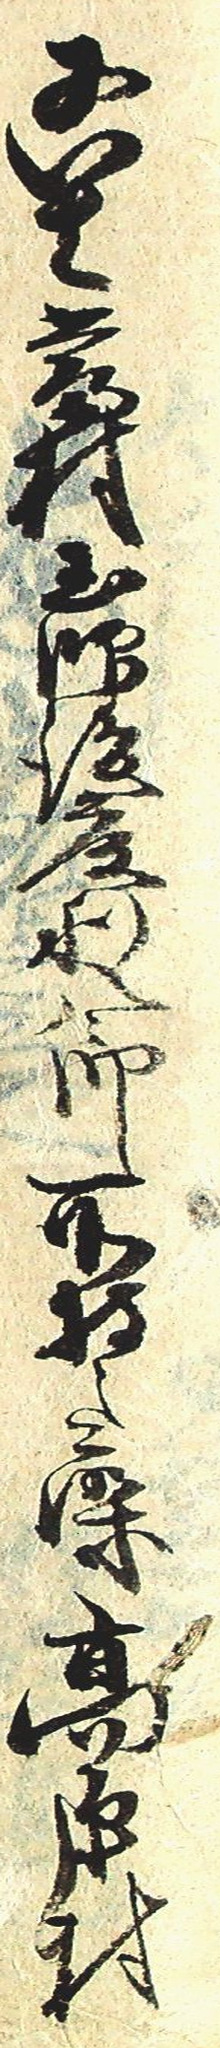右は当村玉師後藤利八郎所持之蒅高原村
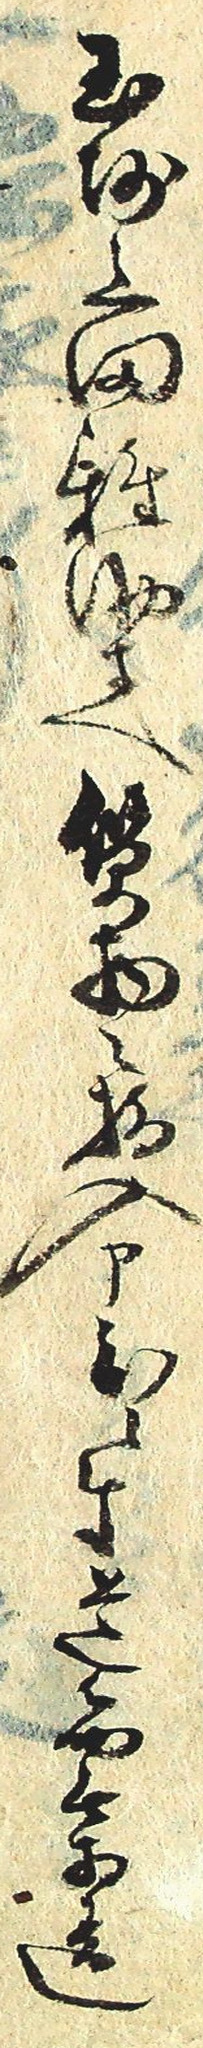玉師上田雅助方へ質物に指入申度に付道筋無相違
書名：諸御願書控(弐番）
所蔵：鳴門教育大学 Naruto University of Education
